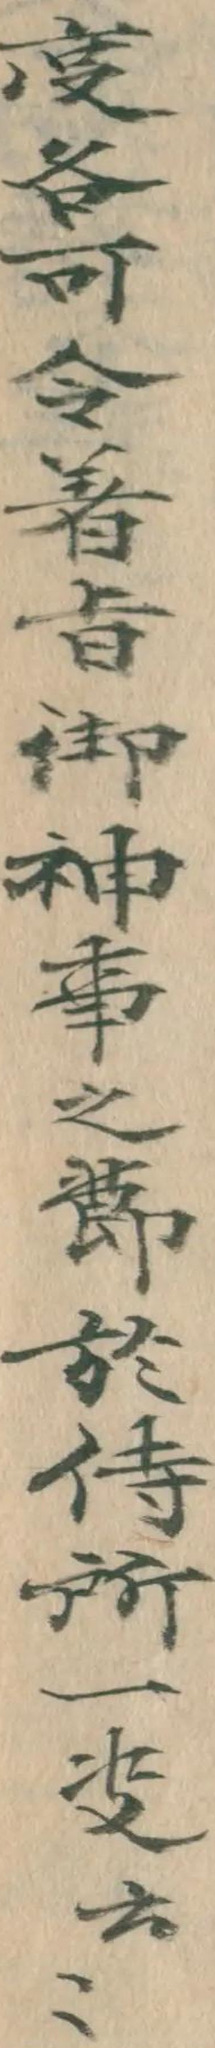度各可令着旨御神事之節於侍所一決云々

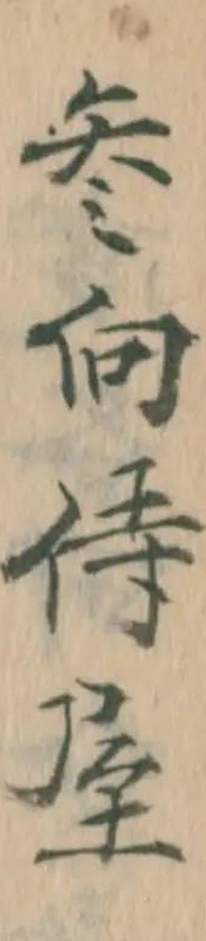参向侍屋
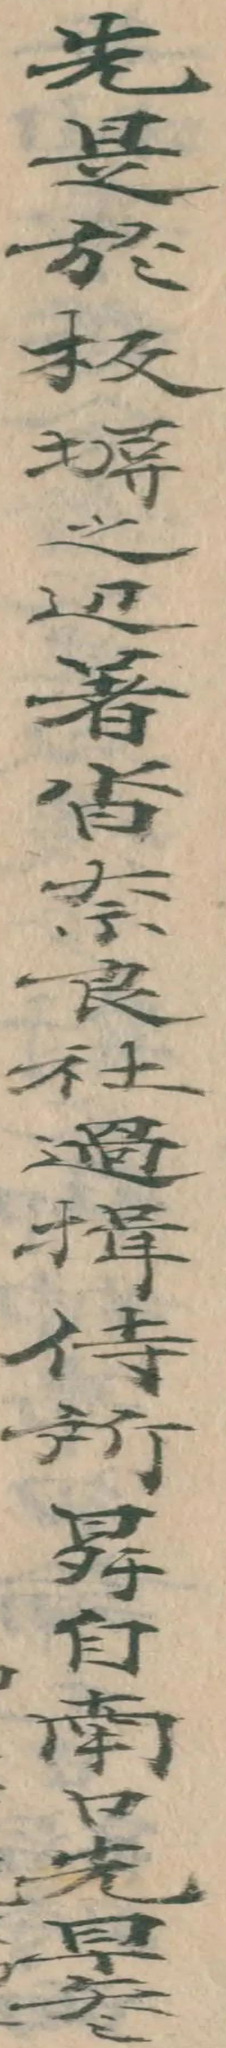先是於板塀之辺着沓奈良社過楫侍所昇自南口先早参
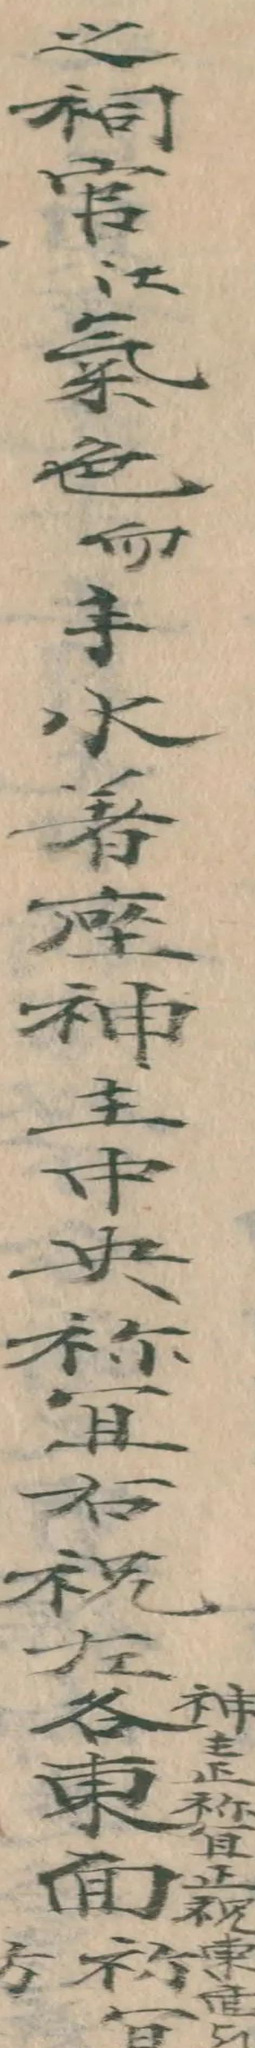之祠官江気色而手水着座神主中央祢宜右祝左各東面祢宜方
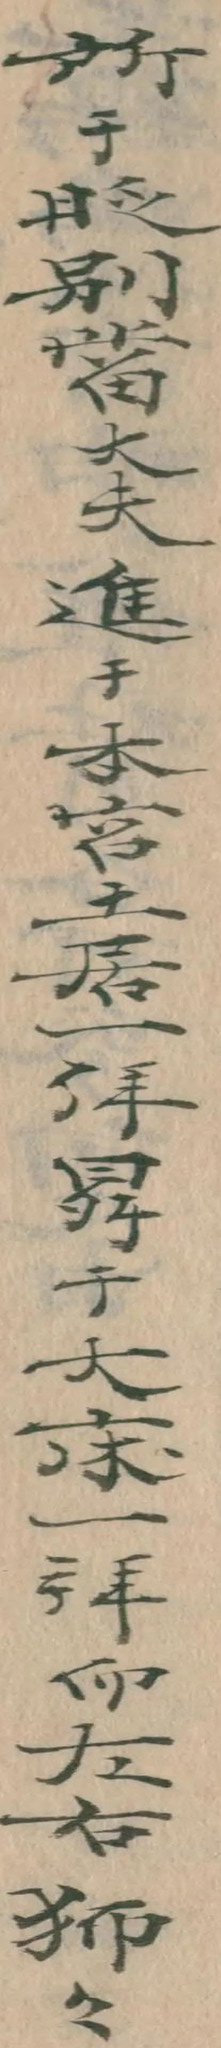所于眨別当大夫進于本宮土居一拝昇于大床一拝而左右獅々
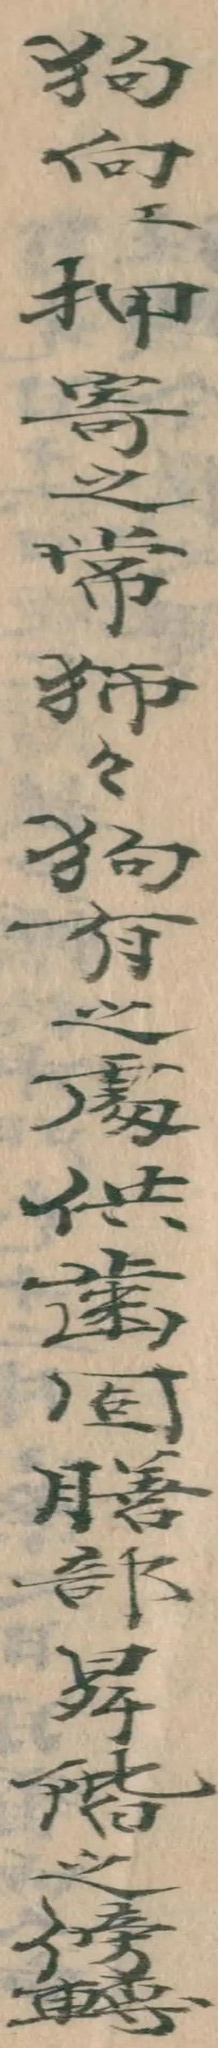狗向エ押寄之常獅々狗有之処供歯固膳部昇階之傍転
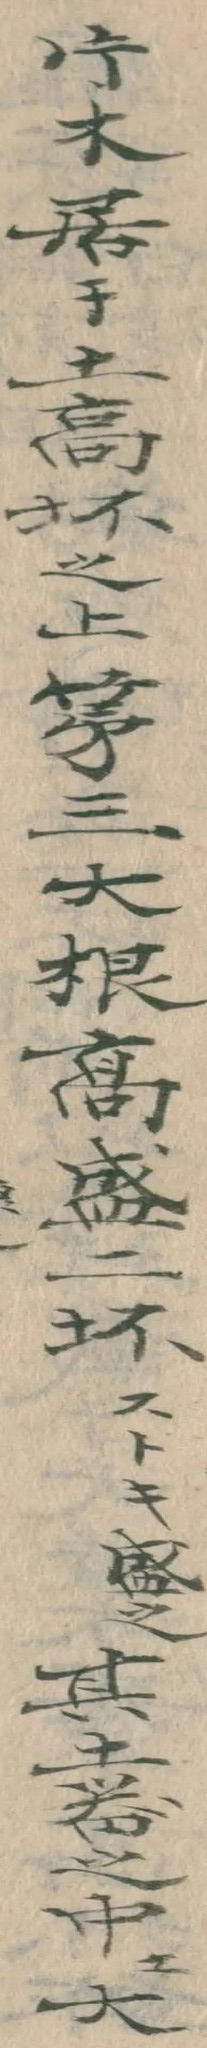片木居于土高抔之上第三大根高盛二坏ストキ盛也其土器之中エ大
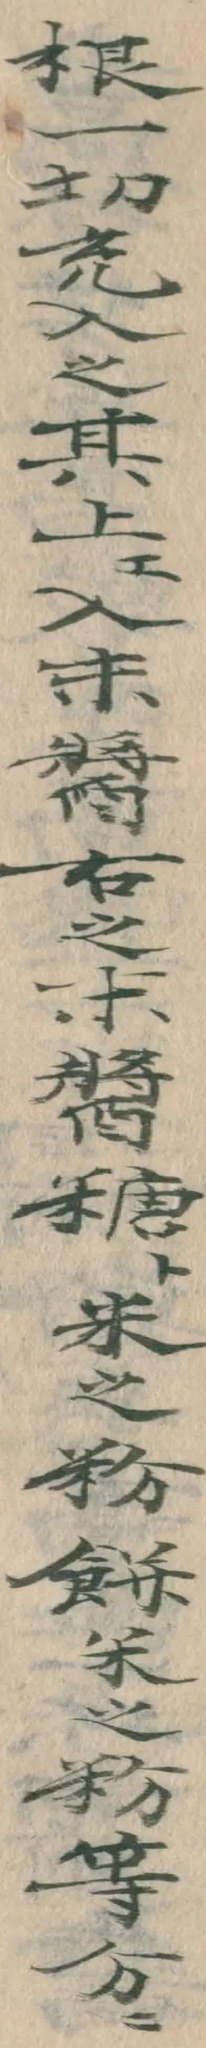根一切充入之其上エ入末醤右之末醤糖ト米之粉餅米之紛等分ニ
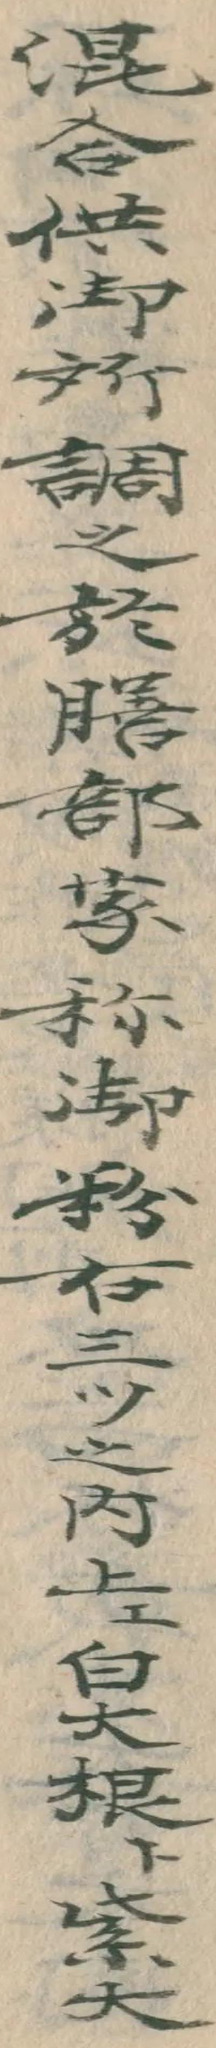混合供御所調之於膳部家称御粉右三ッ之内上エ白大根ト紫大
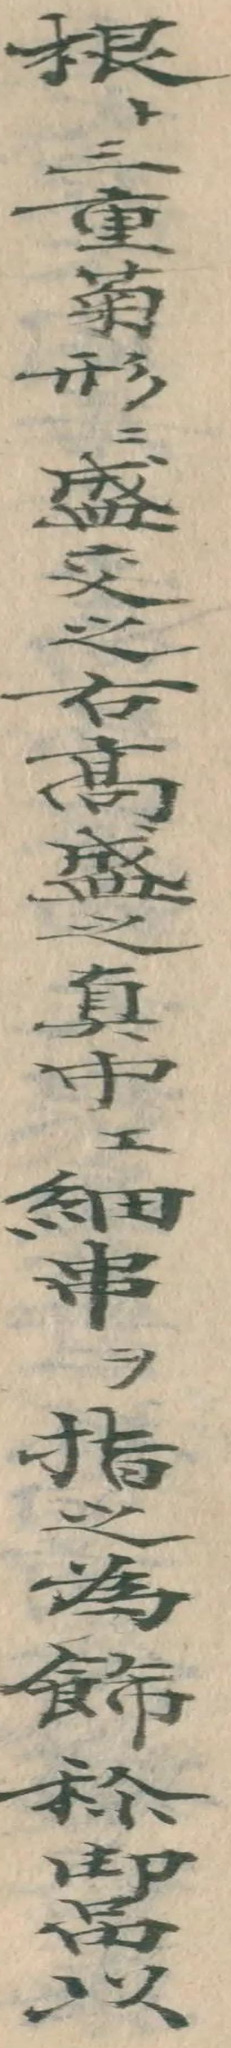根ト三重菊形ニ盛交之右高盛之真中エ細串ヲ指之為飾称御品以
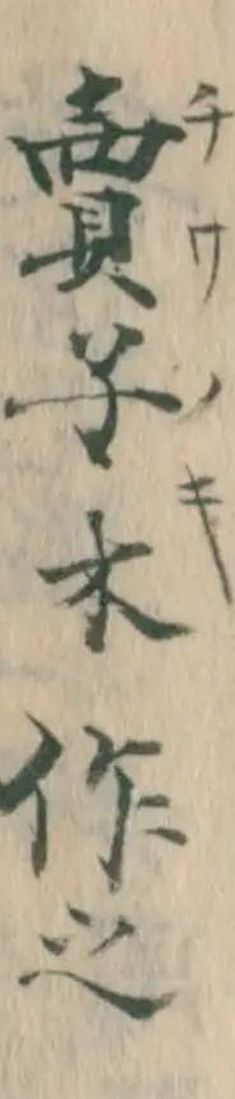売子木作之

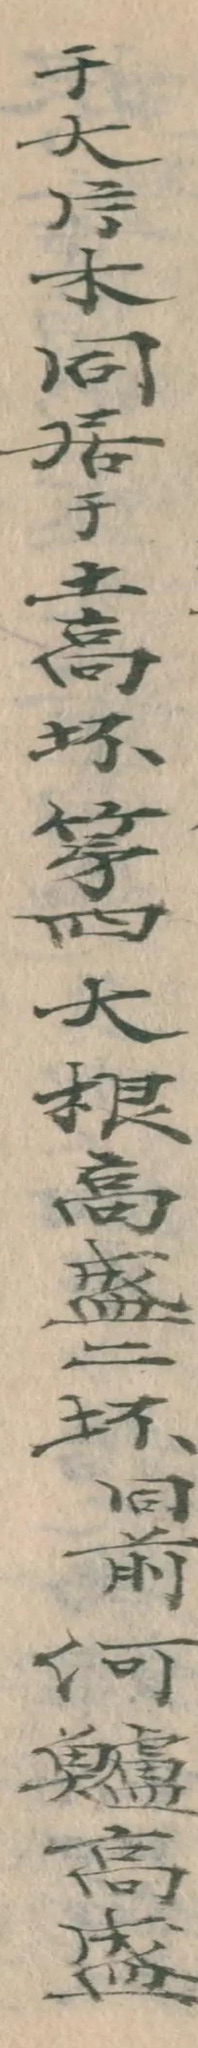于大片木同居于土高坏第四大根高盛二坏同前河鱸高盛
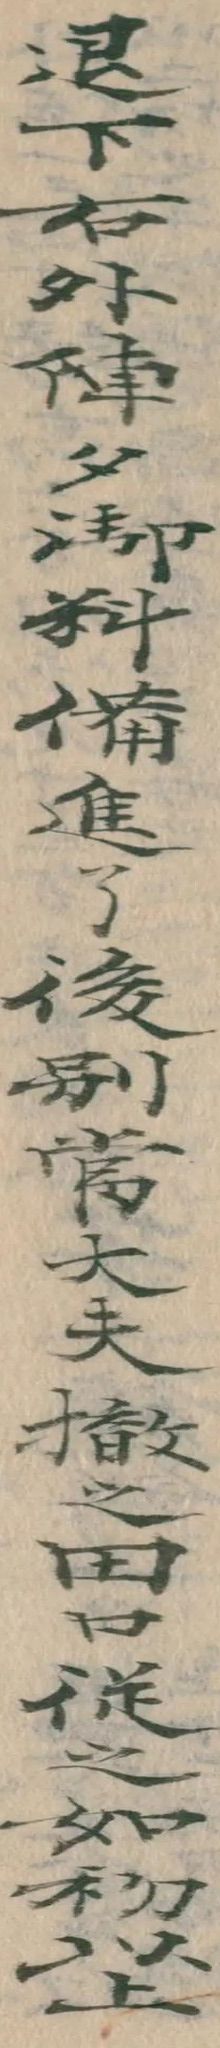退下右外陣タ御料備進了後別当大夫撤之田口従之如初以上
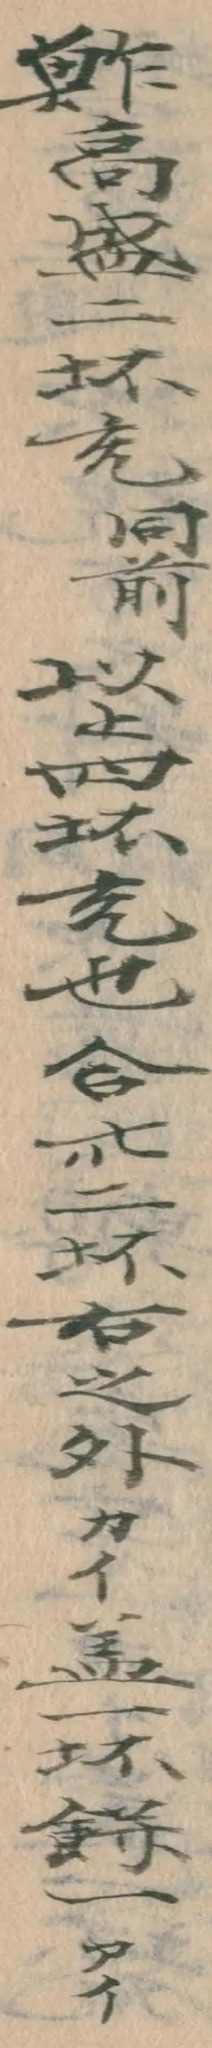鮓高盛二坏充同前以上四坏充也合卅二坏右之外カイ盖一坏餅一アイ
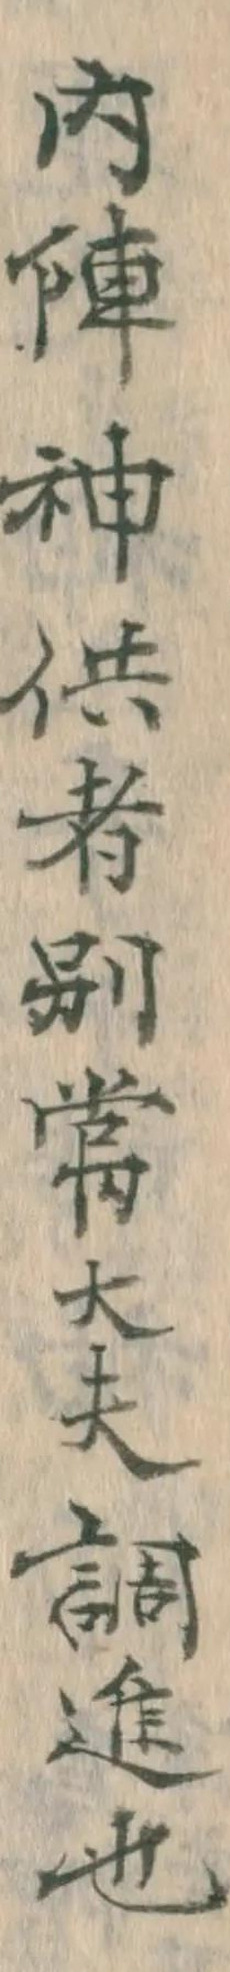内陣神供者別当大夫調進也
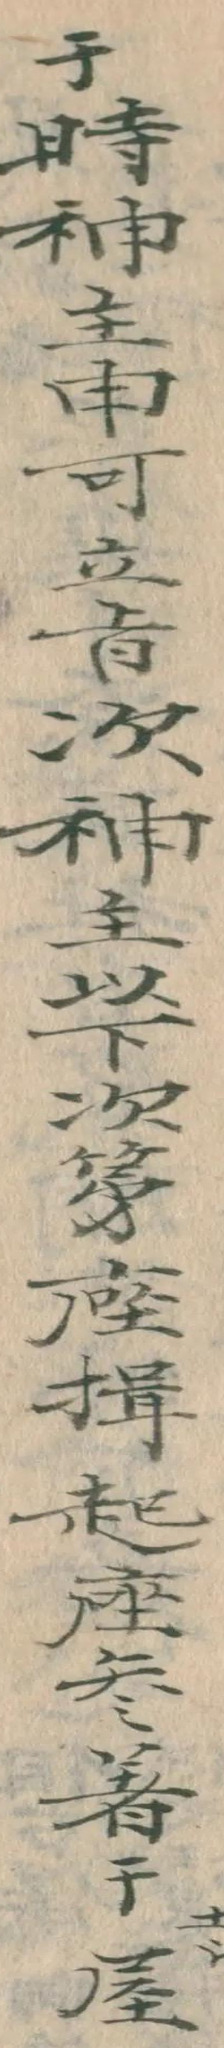于時神主申可立旨次神主以下次第座揖起座参着于屋
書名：賀茂社記録. 第9冊
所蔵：国立国会図書館 National Diet Library, JAPAN
